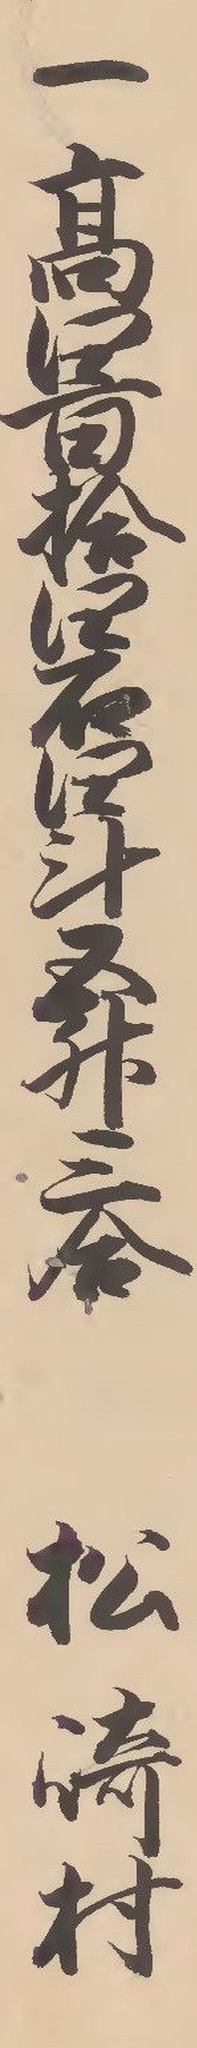一高四百拾四石四斗五升三合松崎村

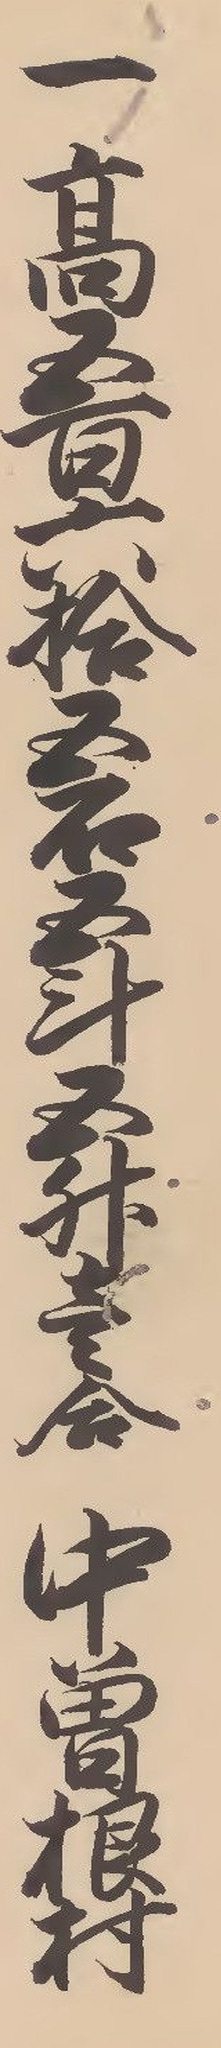一高五百六拾五石五斗五升壱合中曽根村
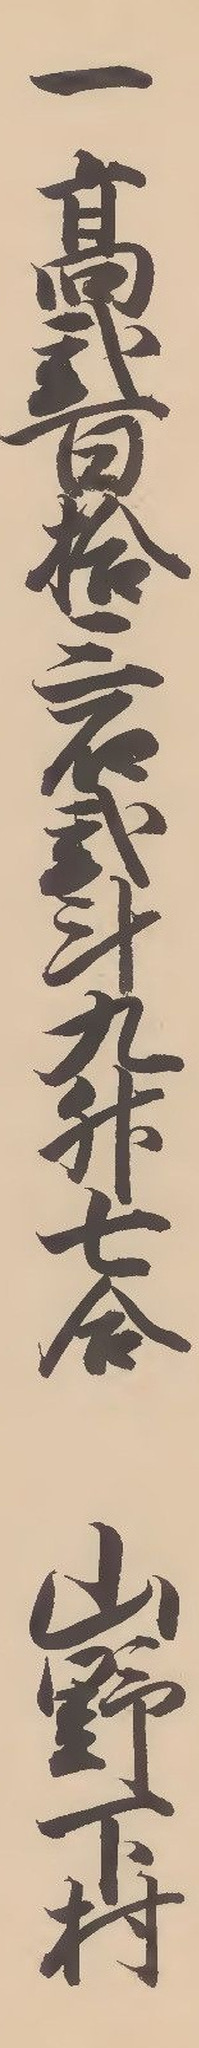一高弐百拾三石弐斗九升七合山野下村
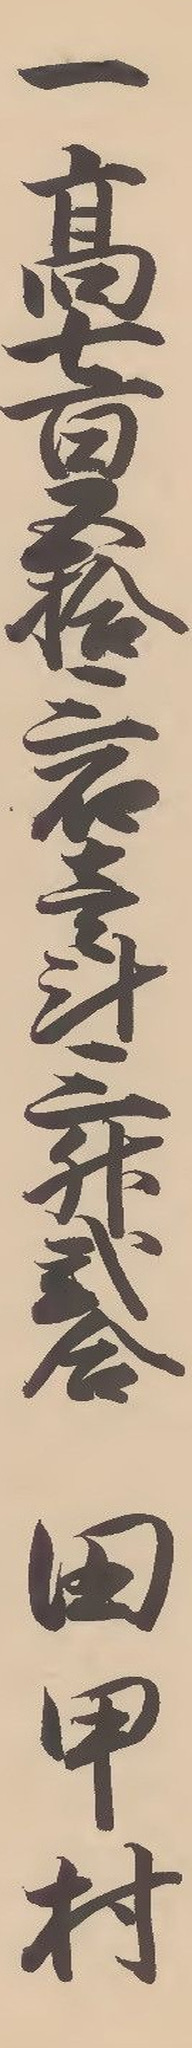一高七百五拾三石壱斗三升弐合田甲村
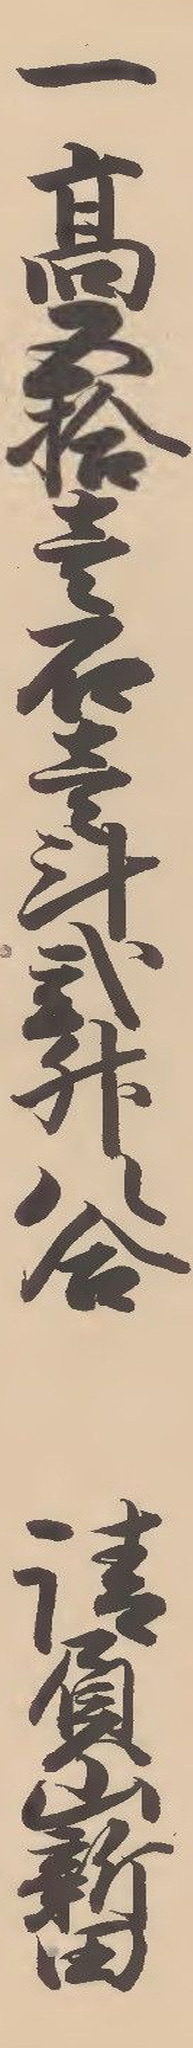一高五拾壱石壱斗弐升八合請負山新田
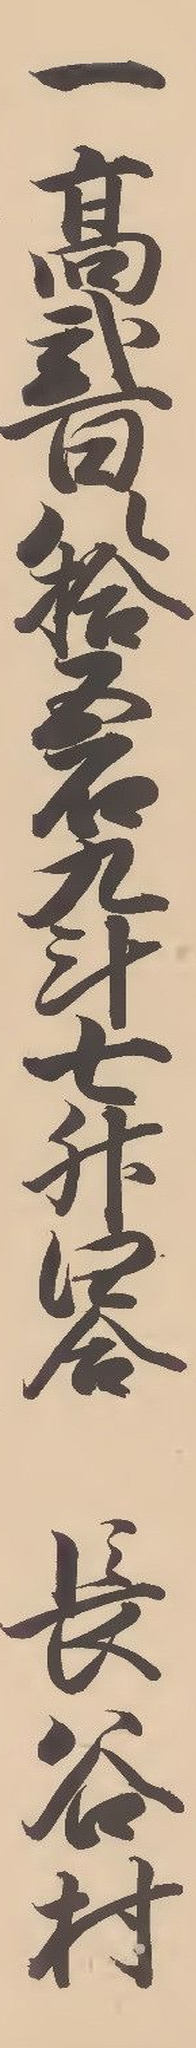一高弐百拾五石九斗七升四合長谷村
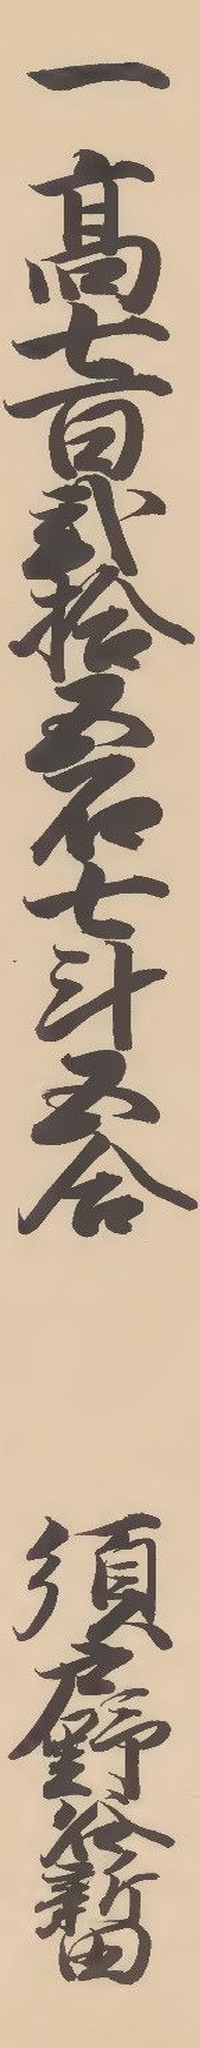一高七百弐拾五石七斗五合須戸野谷新田
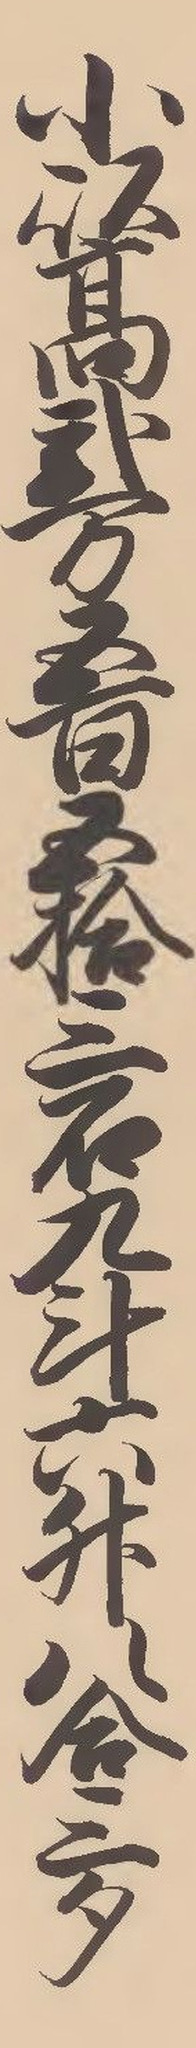小以高弐万五百五拾三石九斗六升八合三勺

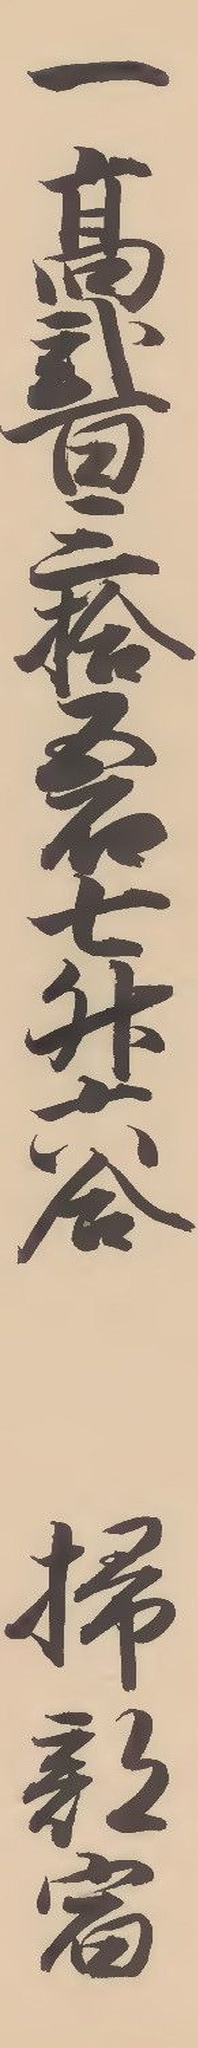一高弐百三拾五石七升六合掃部宿
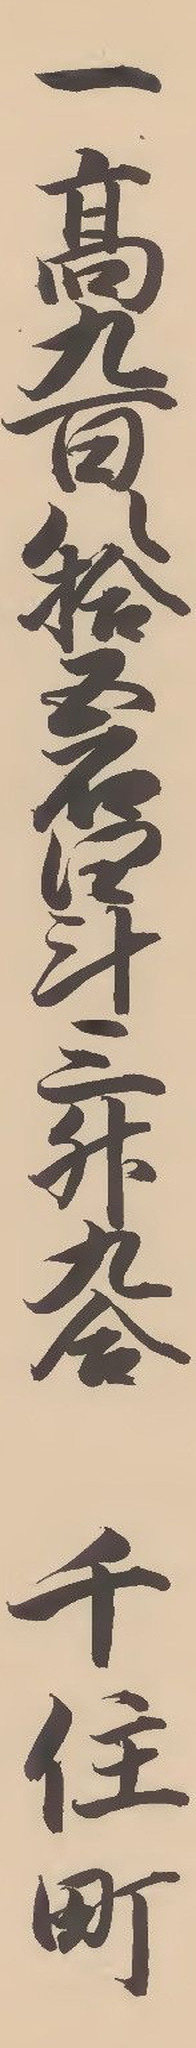一高九百八拾五石四斗三升九合千住町
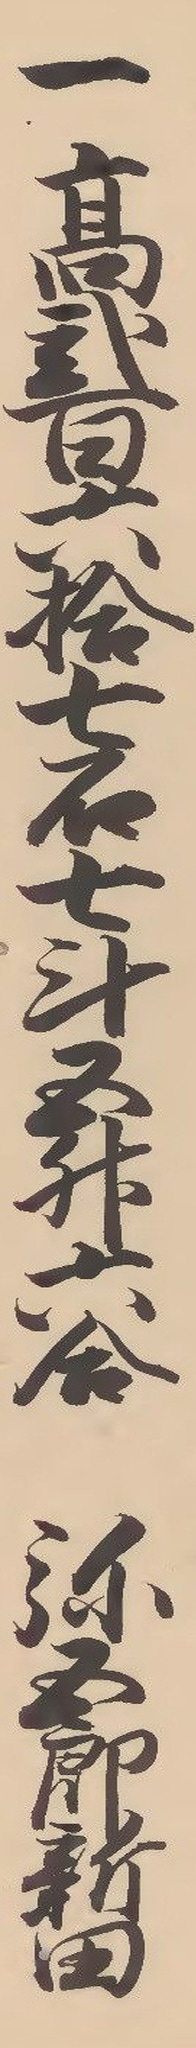一高弐百六拾七石七斗五升六合弥五郎新田
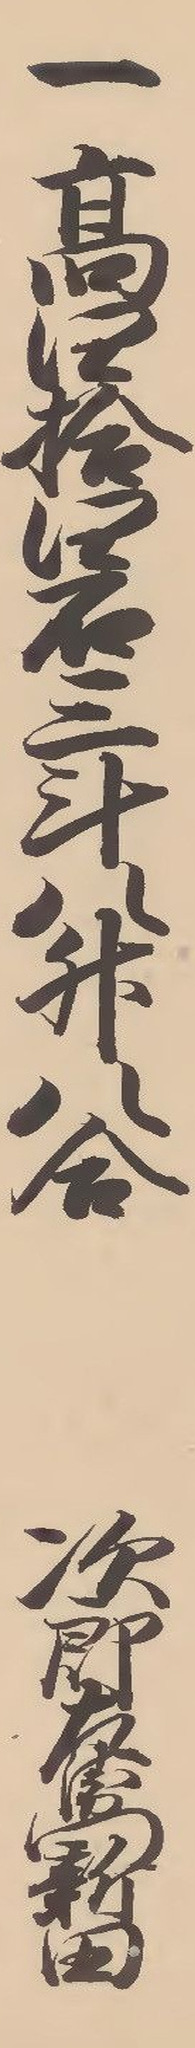一高四拾四石三斗八升八合次郎左衛門新田
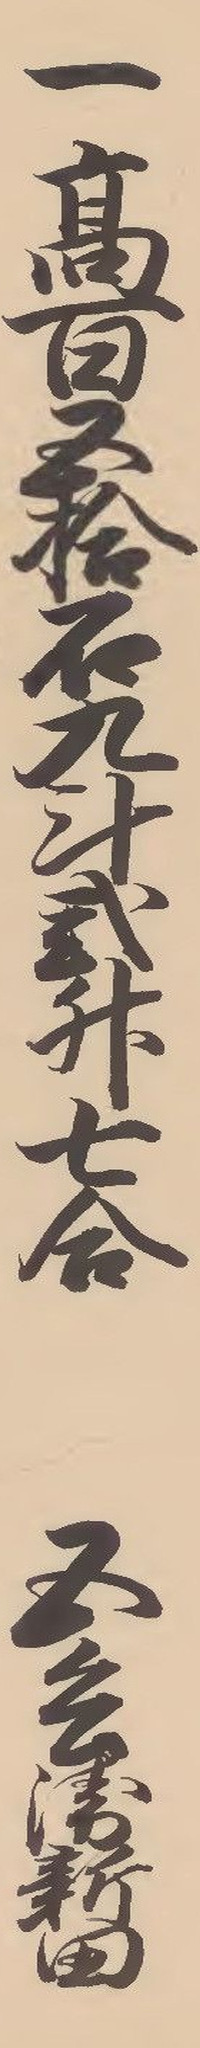一高百五拾石九斗弐升七合五兵衛新田
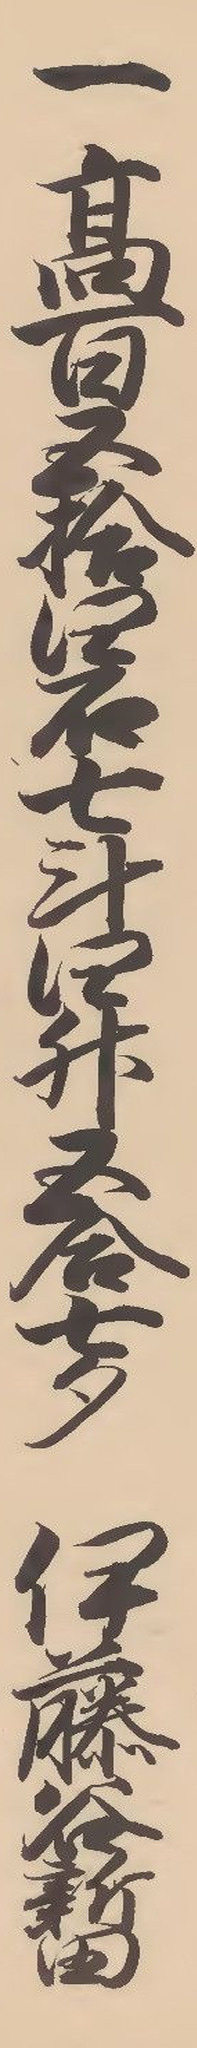一高百五拾四石七斗四升五合七勺伊藤谷新田
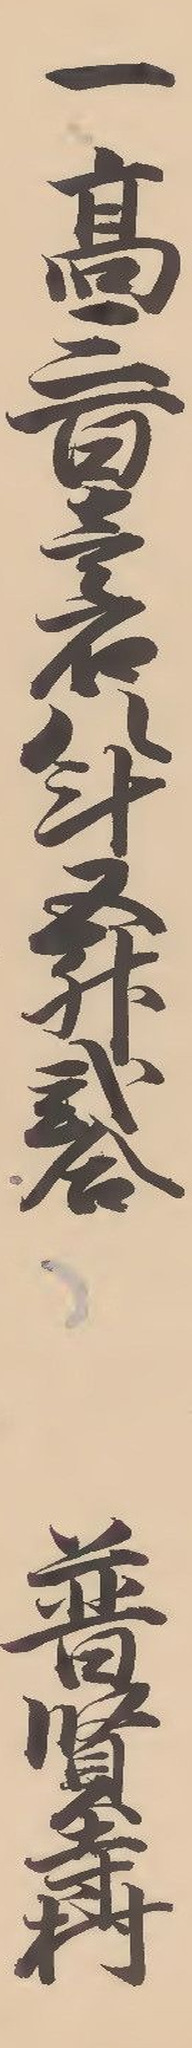一高三百壱石八斗五升弐合普賢寺村

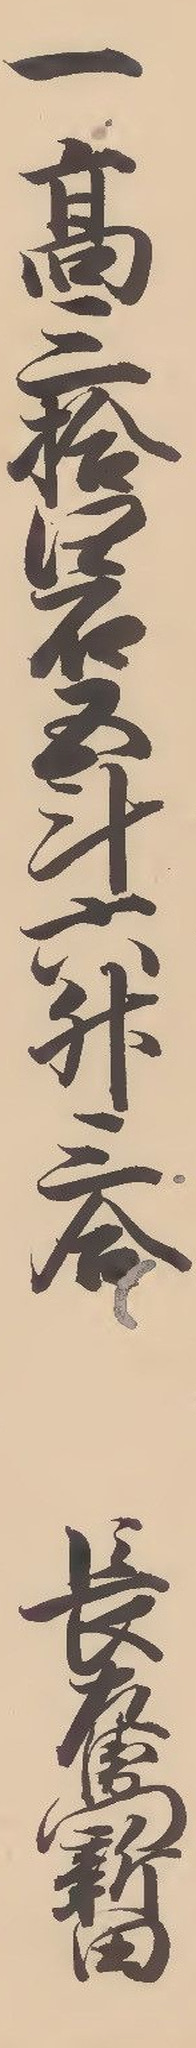一高三拾四石五斗六升三合長右衛門新田
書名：武蔵国郷帳　下
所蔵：国立公文書館 National Archives of Japan
